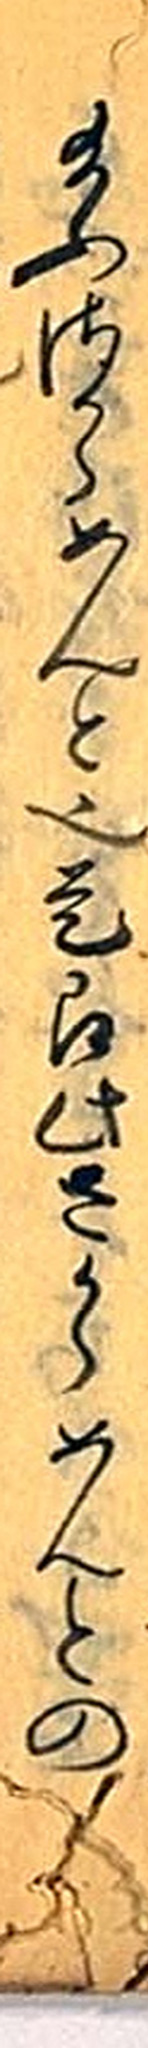給ふさからめんと也是即此さからめんとの
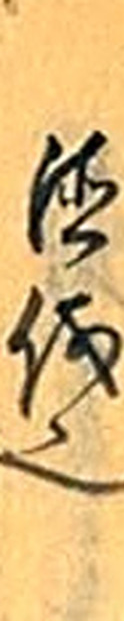徳儀也
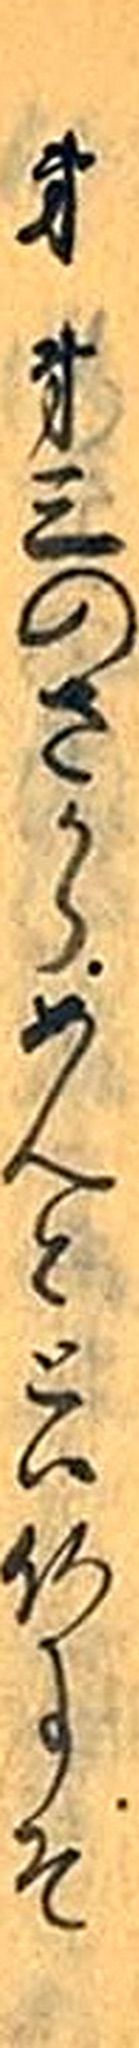弟第三のさからめんととは何事そ
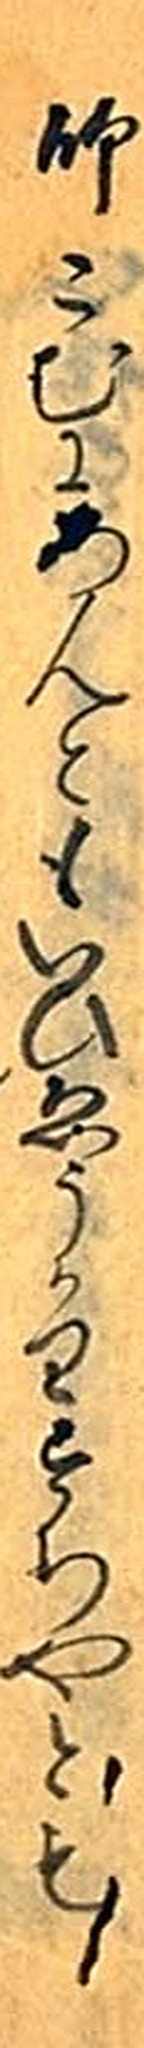師こむにあんともいひゑうかりすちやとも
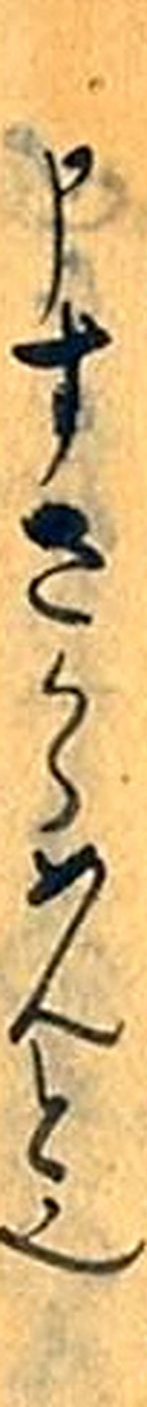申すさからめんと也
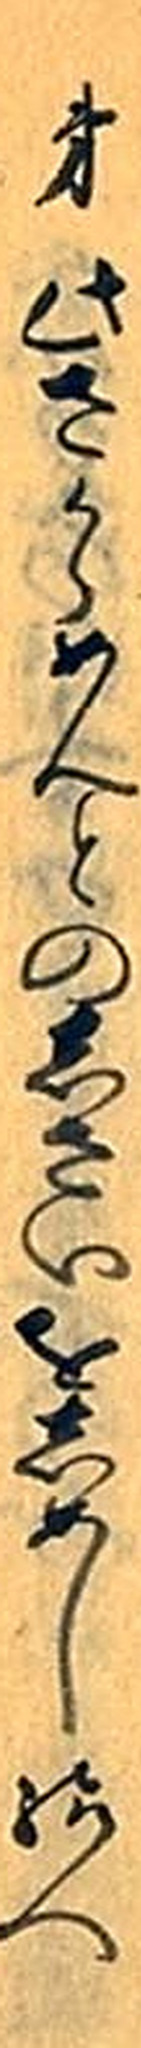弟此さからめんとのしさいをしめし給へ
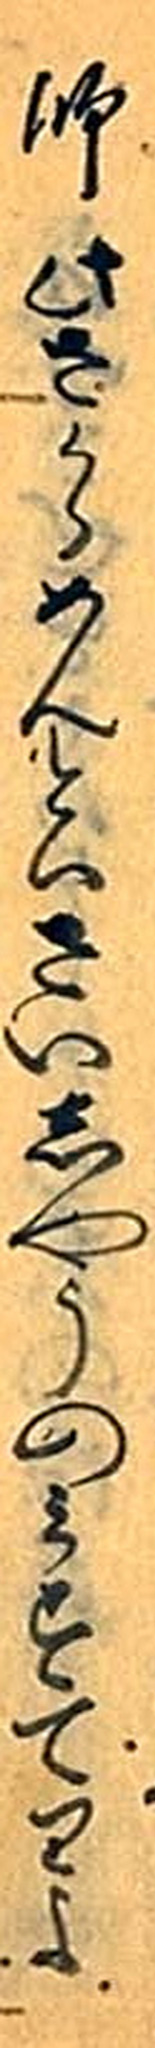師此さからめんとはさいしやうのみすてりよ
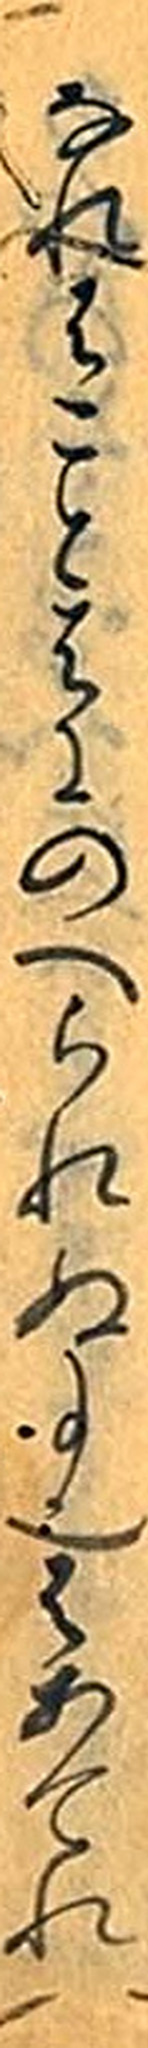なれはことはにのへられぬ事也はあてれ
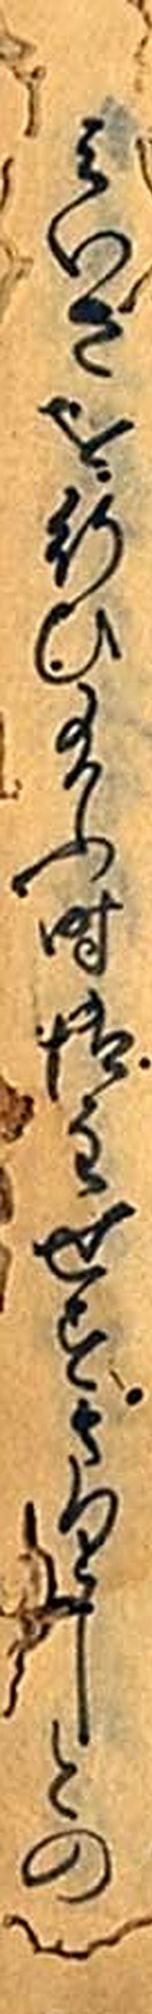みいさを行ひ給ふ時御主せすきりしとの

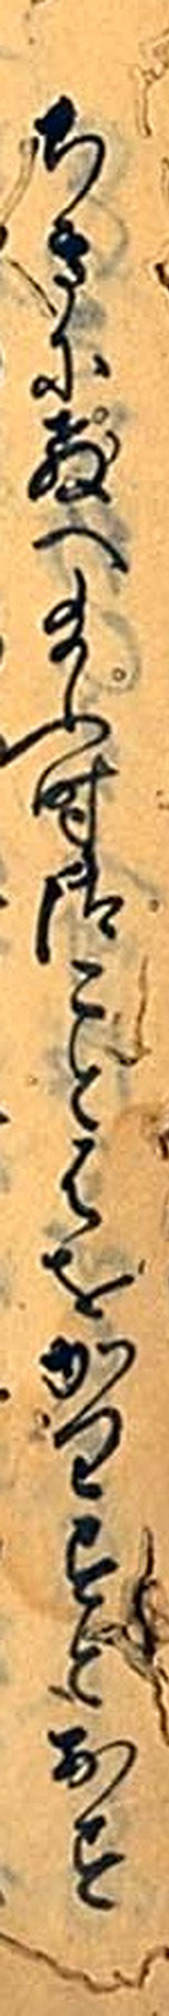ちきに教へ給ふ時御ことはをかりすとおす
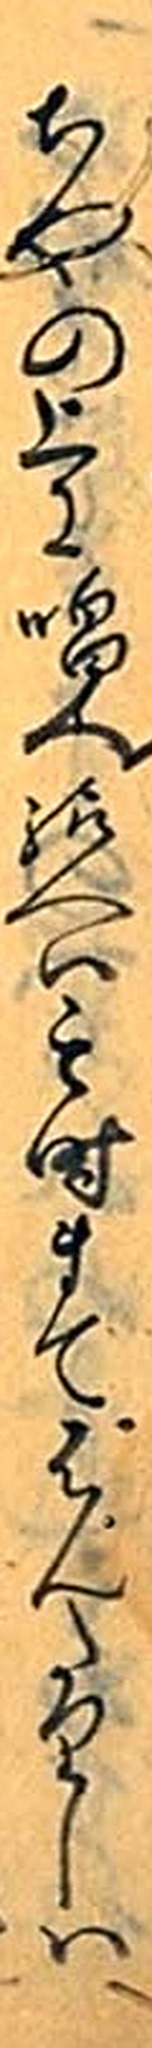ちやの上に唱へ給へは其時まてはんたりしは
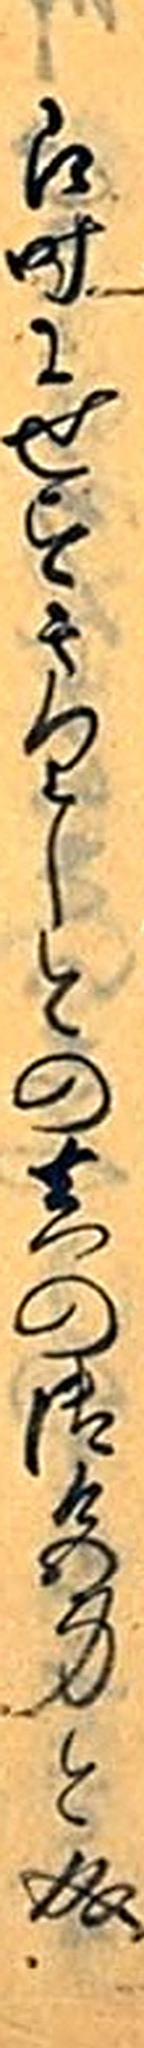即時にせすきりしとの真の御色身と成
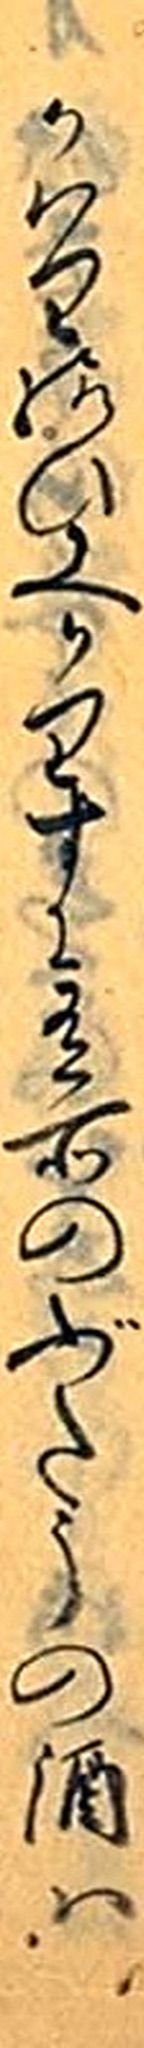かはり給ひ又かりすに有所のぶたうの酒は
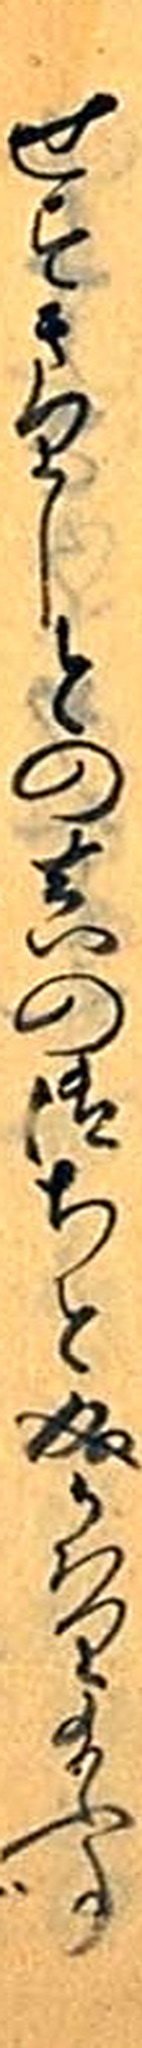せすきりしとの真の御ちと成かはり給ふ事
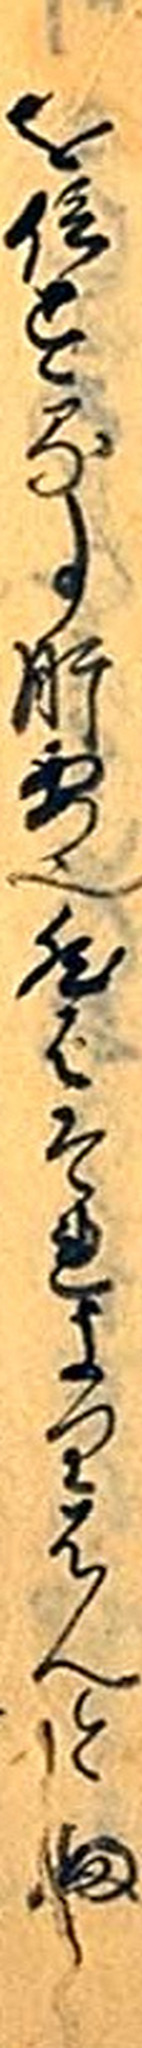を信する事肝要也然はそれよりはんとぶ
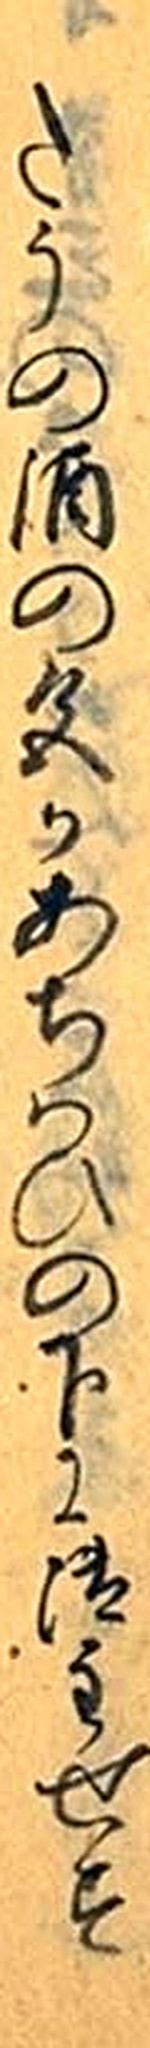たうの酒の色かあちはひの下に御主せす
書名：ドチリナ・キリシタン
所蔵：東京大学総合図書館 / General Library in the University of Tokyo
